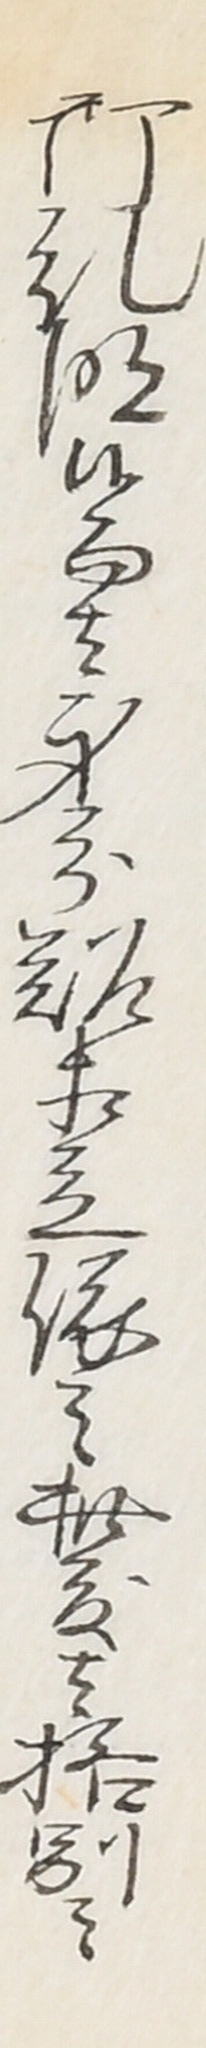御糺明候而は身分難相立依之此度は格別之
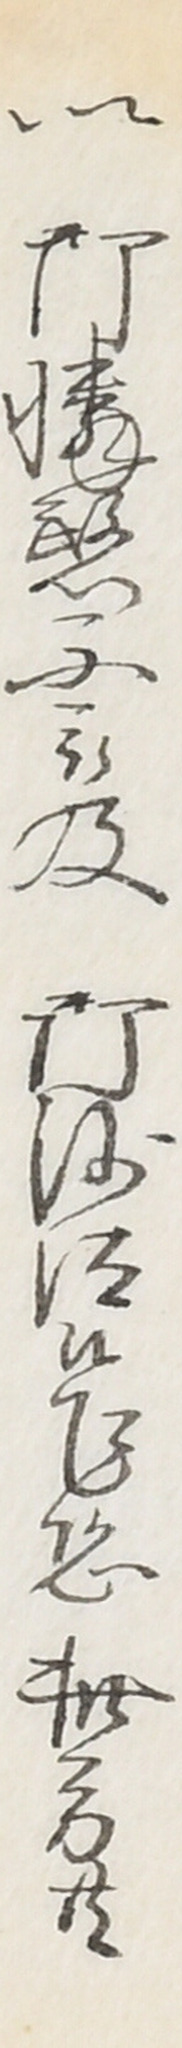以御憐愍不被及御沙汰候乍恐此方共
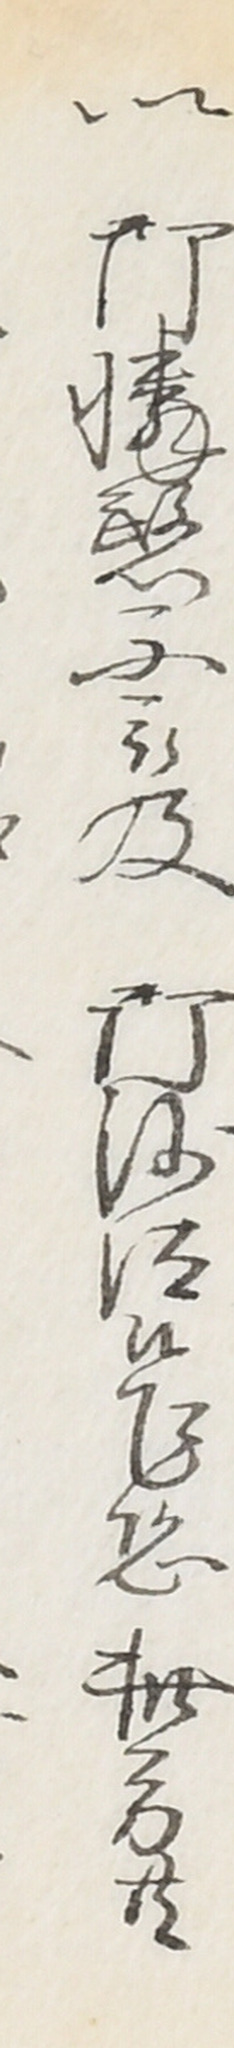以御憐愍不被及御沙汰候乍恐此方共
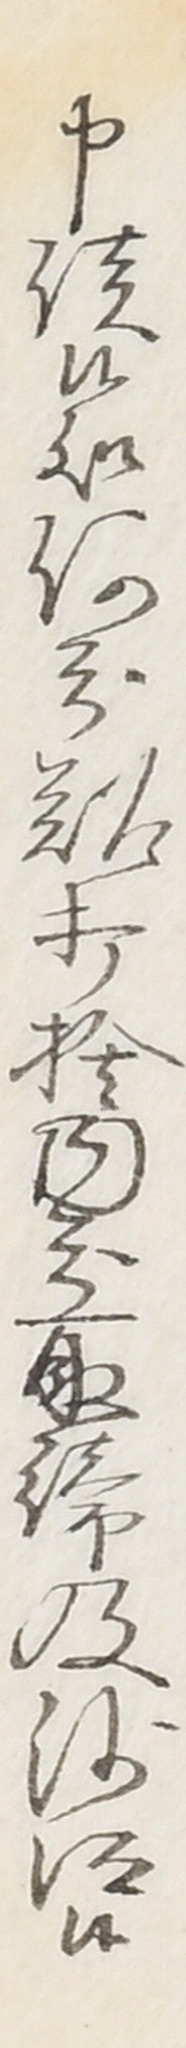申談候処何分難打捨内分取締及沙汰候
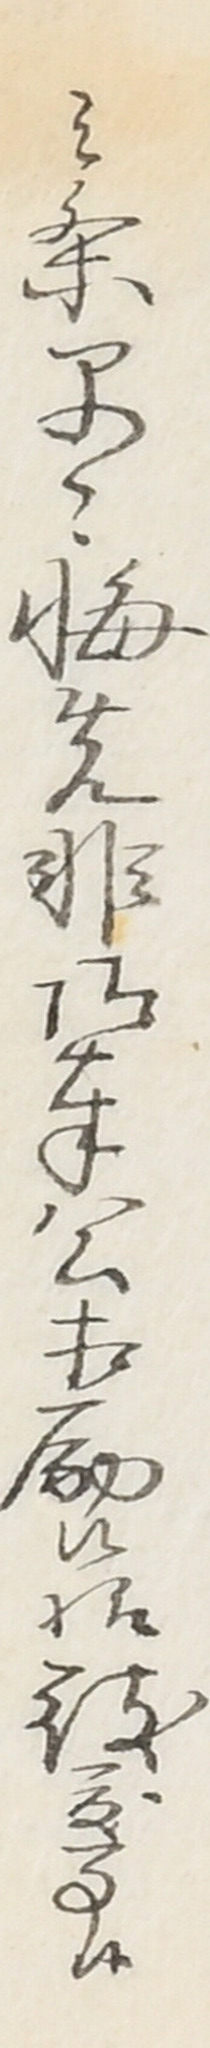之条早々悔先非御奉公相励候様致度事候
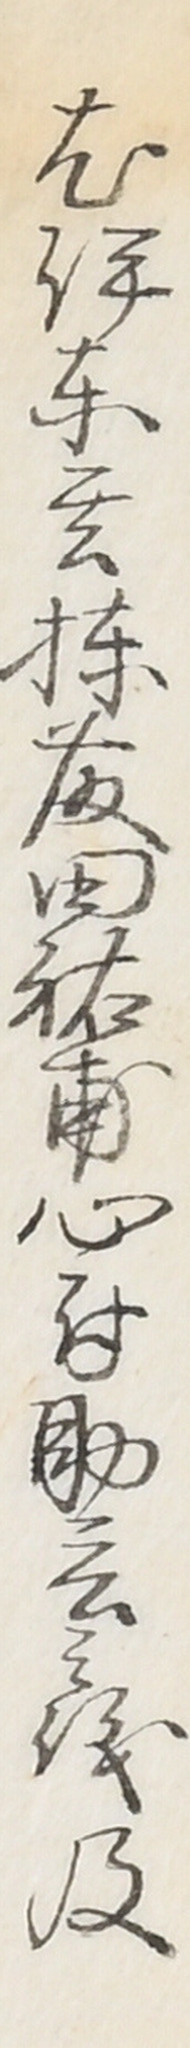尤伊東玄棟藤田祐甫心付助言之儀及
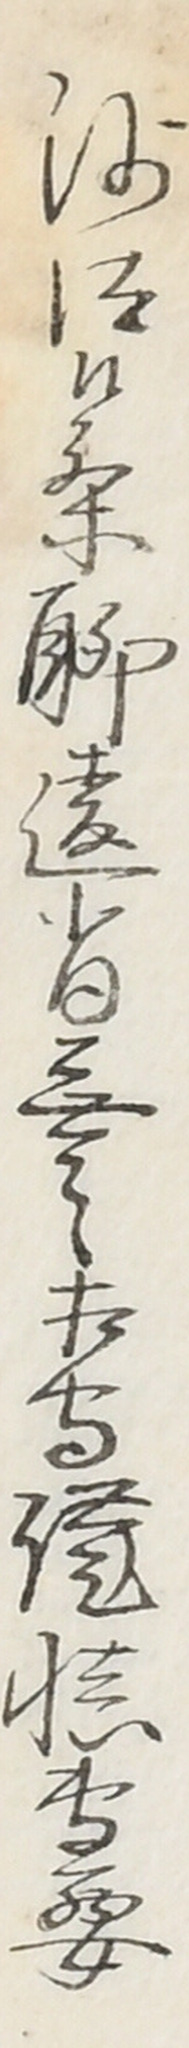沙汰候条聊位牌違背無之相守勤謹専要
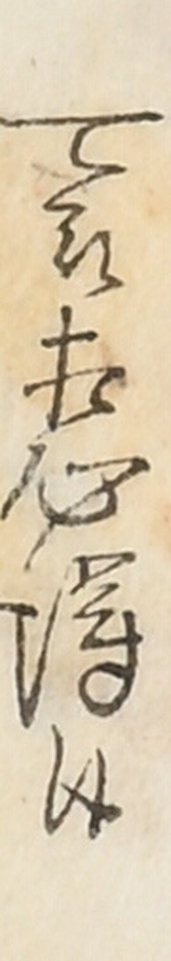可被相心得候
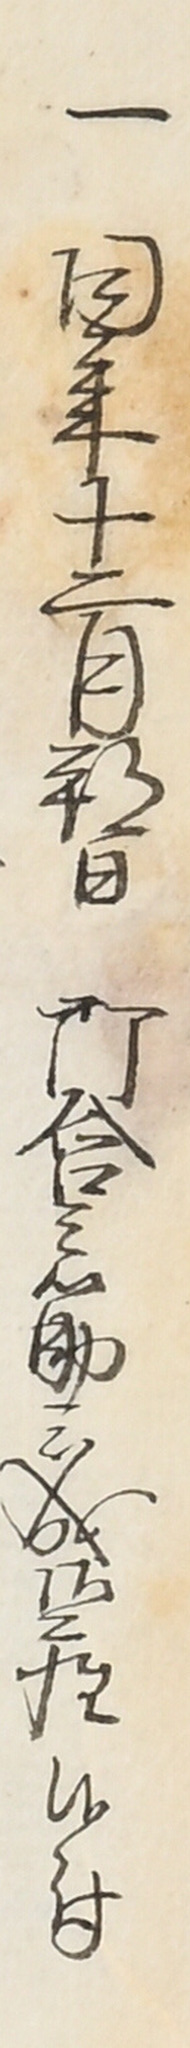一同年十二月朔日御含之筋被成御座候付
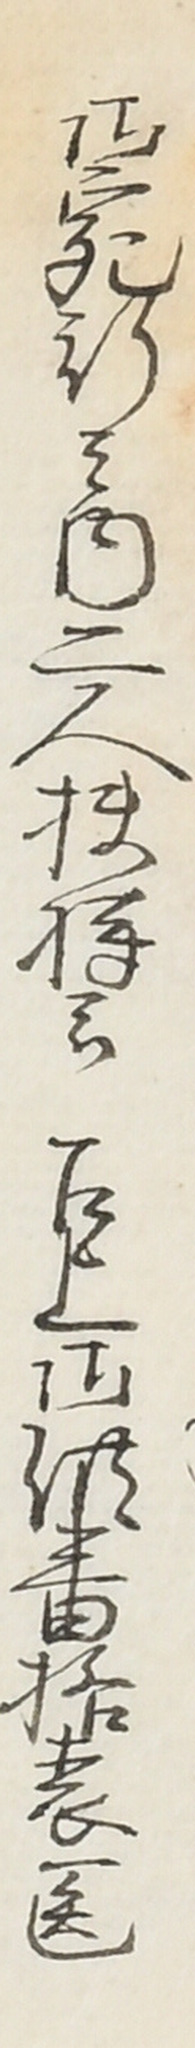御宛行之内二人扶持被召上御供番格表医
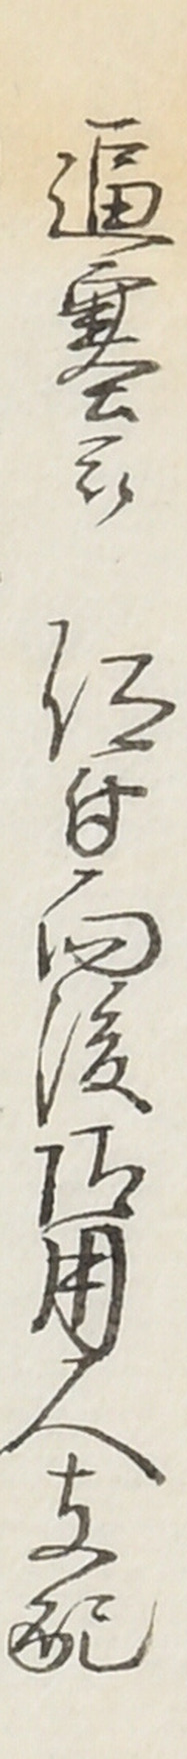逼塞被仰付向後御用人支配
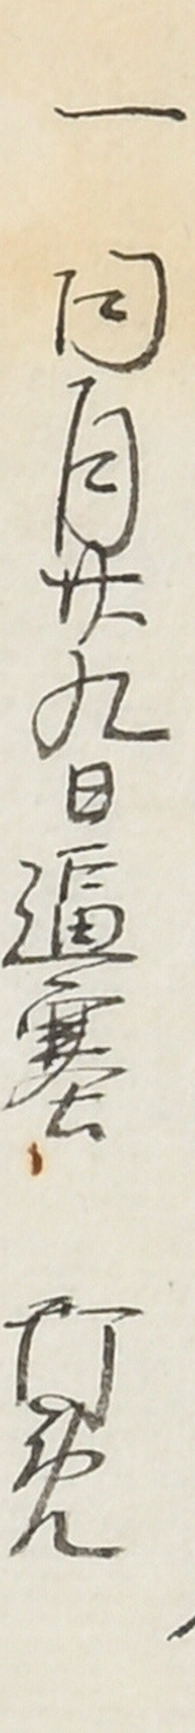一同月廿九日逼塞御免
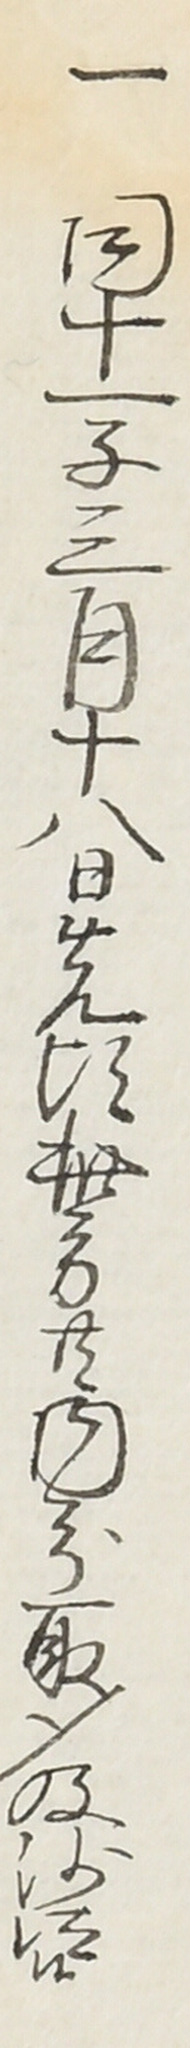一同十一子三月十八日先頃此方共内分取〆及沙汰候
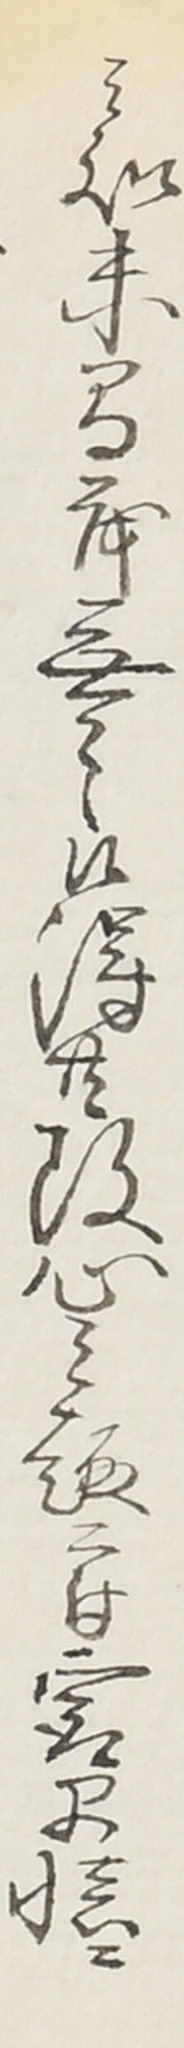之処未間茂無之候得共改心之趣ニ付最早慎ニ
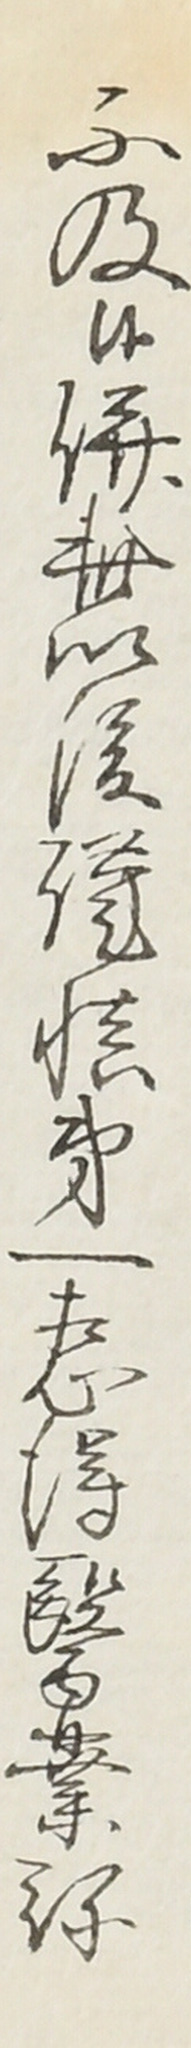不及候併此以後謹慎第一相心得医業弥
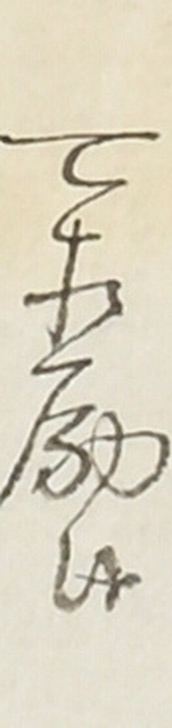可相励候
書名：給人諸士勤仕録（七）
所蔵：伊那市立高遠町図書館・合同会社AMANE
